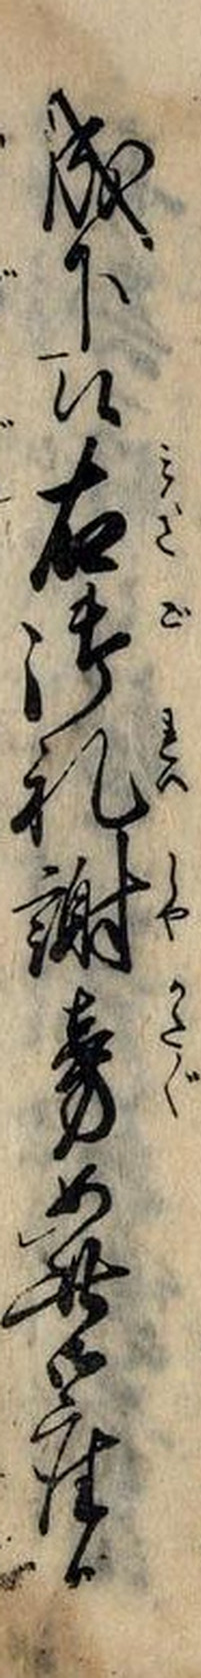成下候右御礼謝旁如此御座候
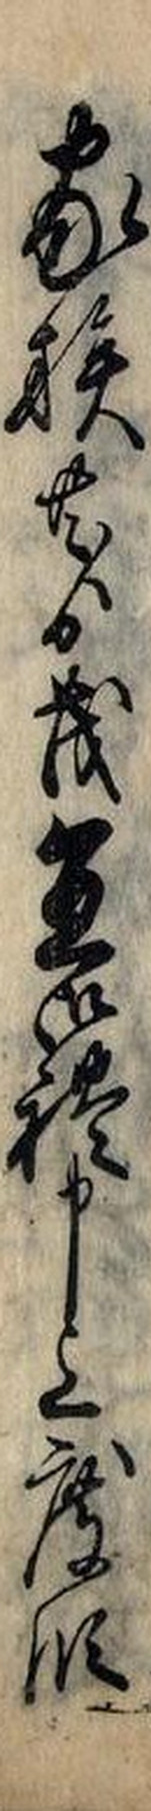家族共ゟも宜御禮申上度段
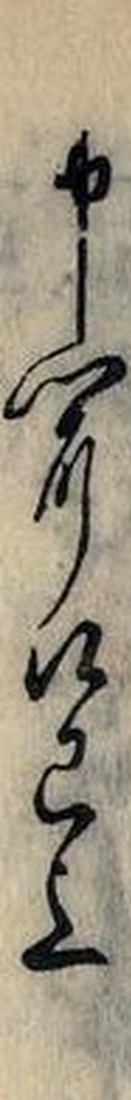申聞候已上
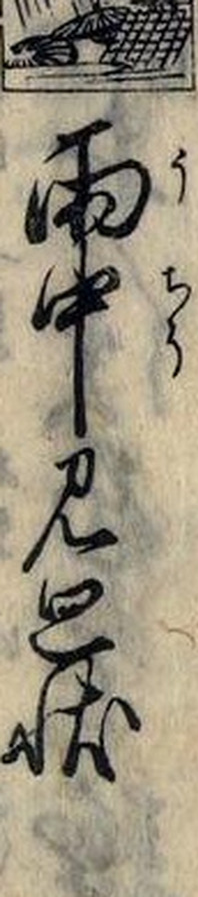雨中見廻状

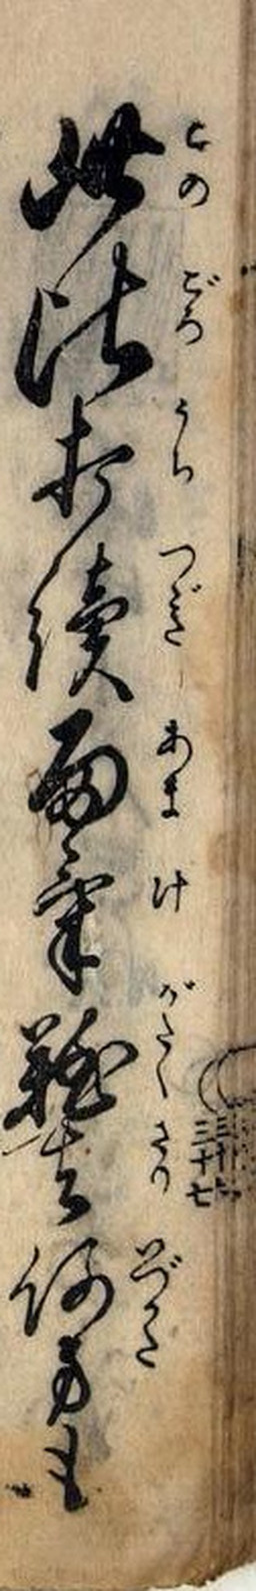此比打續雨氣難去何方も
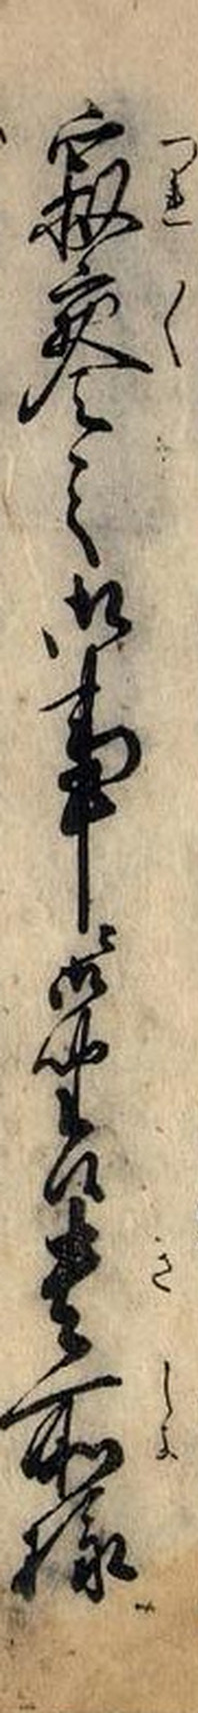寂寥之御事に御座候貴所様
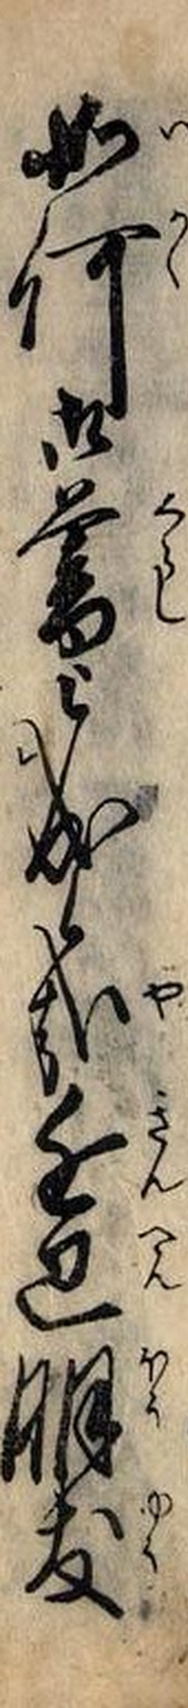如何御暮被成候哉近辺朋友
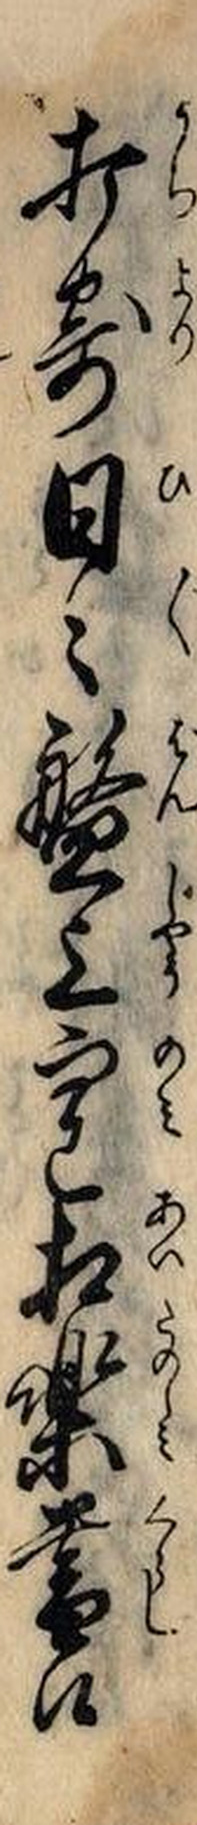打寄日々盤上而已相楽暮候
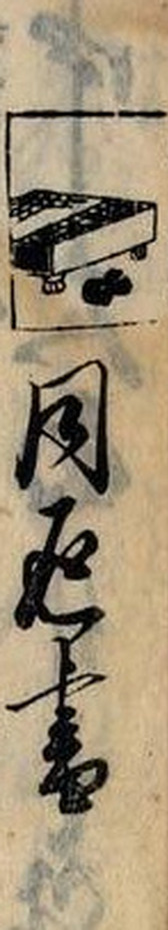同返書
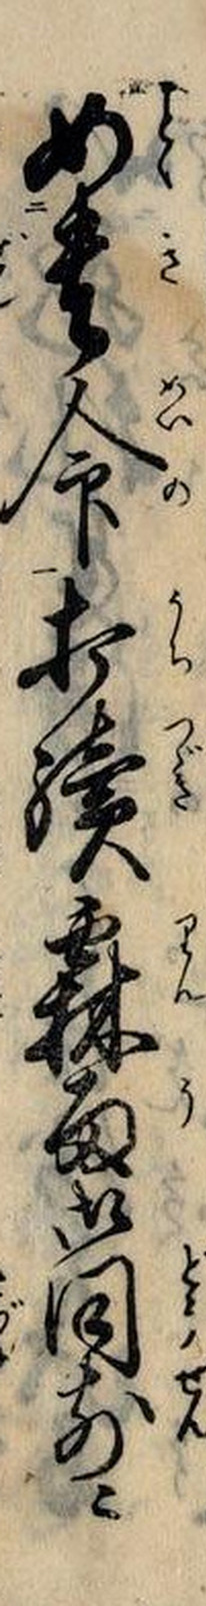如貴命打續霖雨御同前に
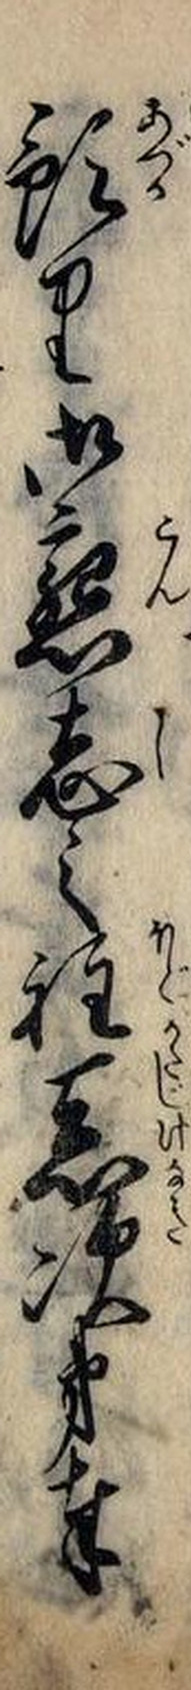預り御懇志之程忝次第奉

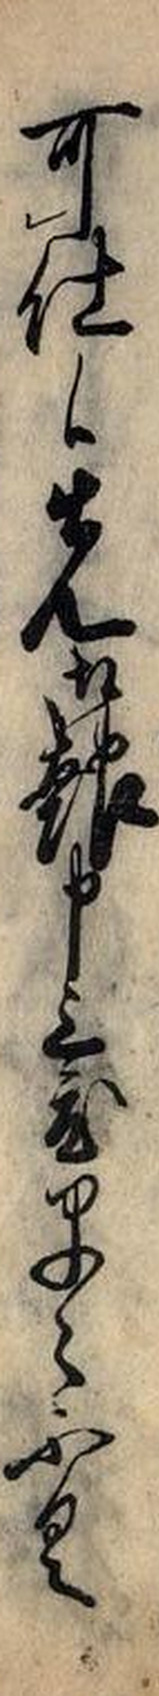可仕候先御報申上度早々不具
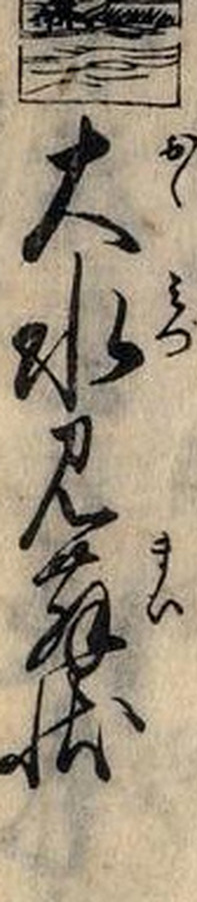大水見舞状
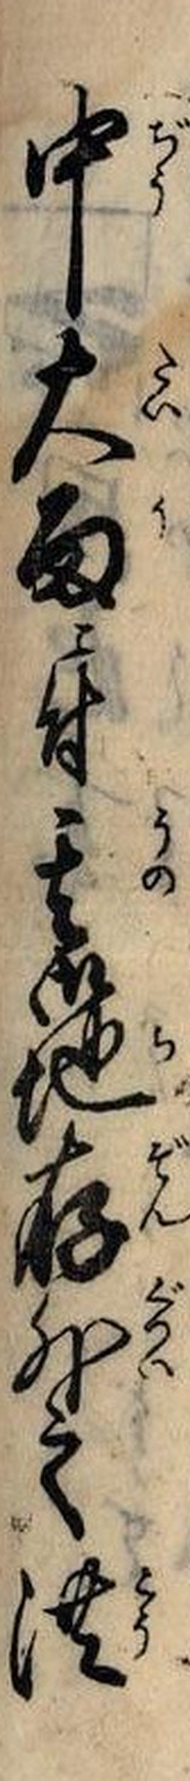中大雨に付其御地存外之洪
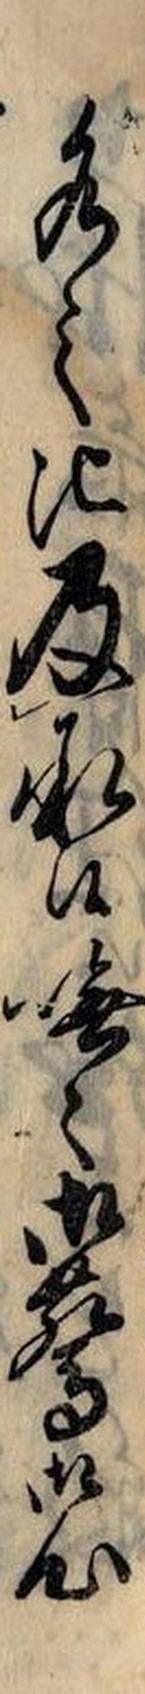水之由及承候嘸々御驚御心
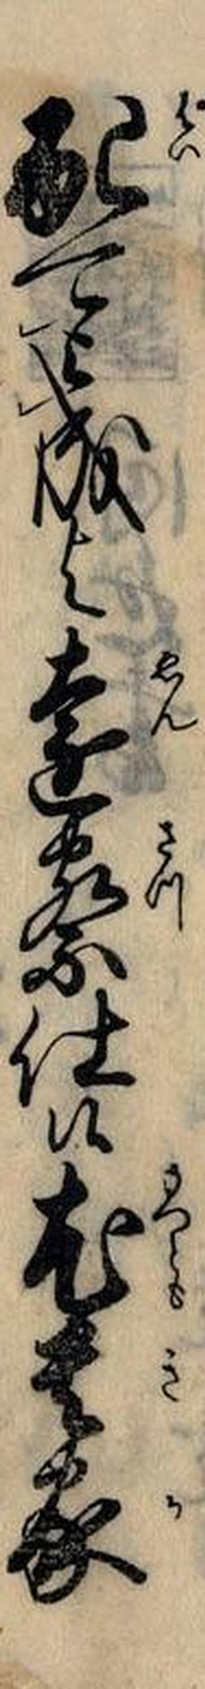配可被成与遠察仕候尤貴家
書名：大成用文章（往来物）
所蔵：福井県文書館 Fukui Prefectural Archives
